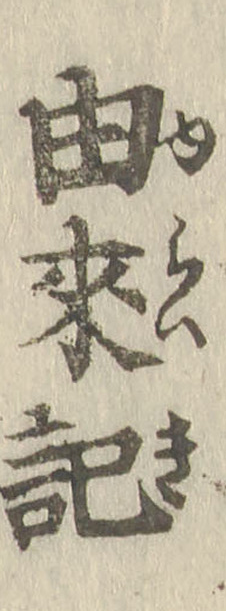由来記
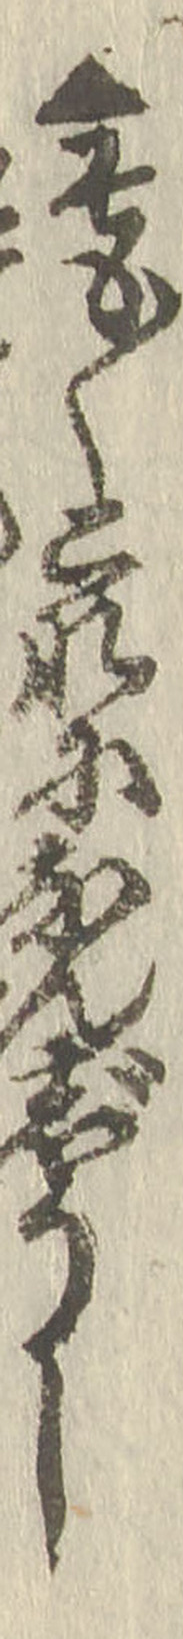▲そも〳〵これになんじうし
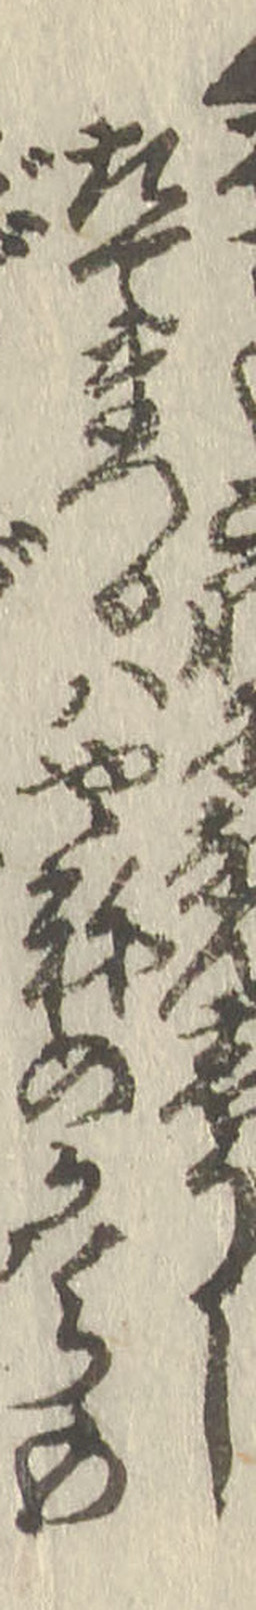たてまつるはやねのかはらの
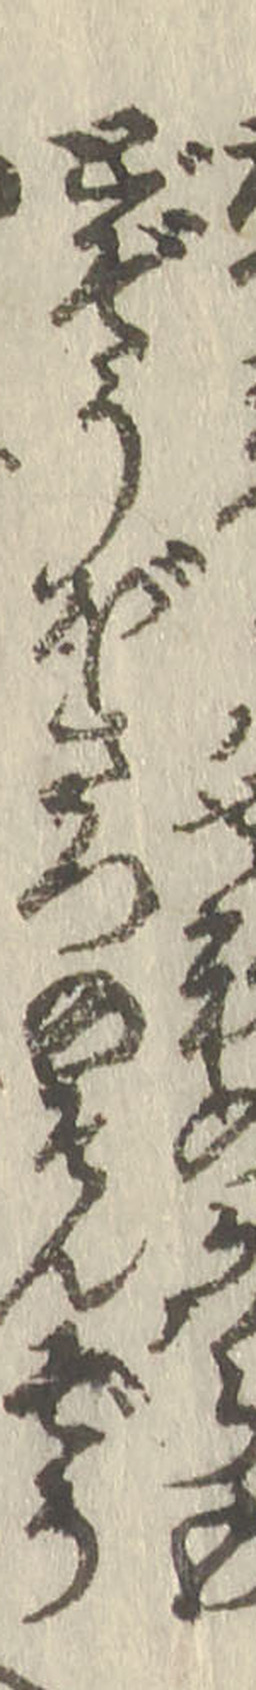どぞうぼさつのそんぞう
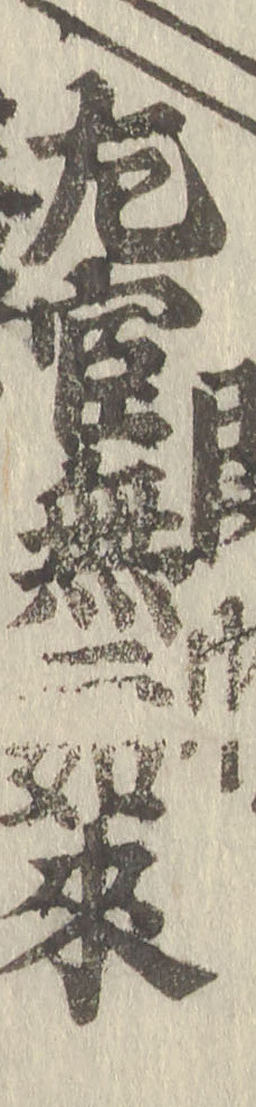左官無二如来
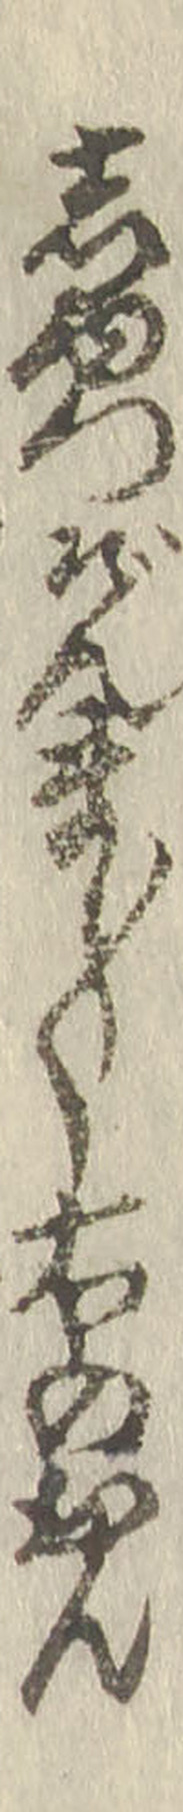しゆつげんまし〳〵右のおん
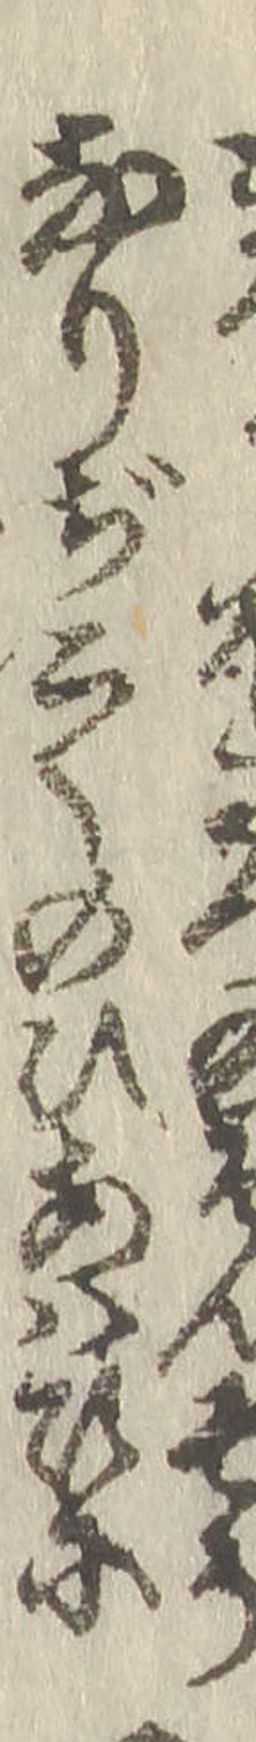なりぢこくのひあはきに
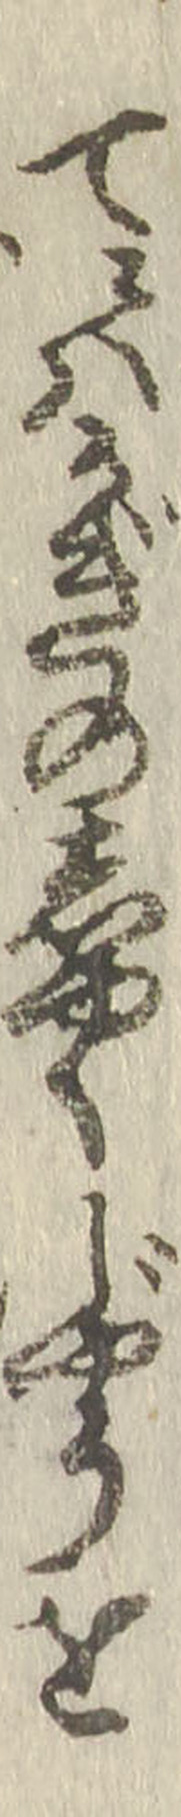てにはかぎのしやくじやうを
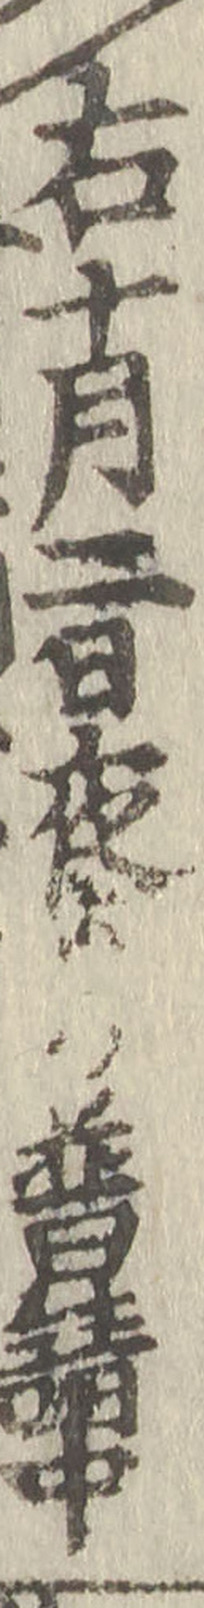右十月二日夜より普請中
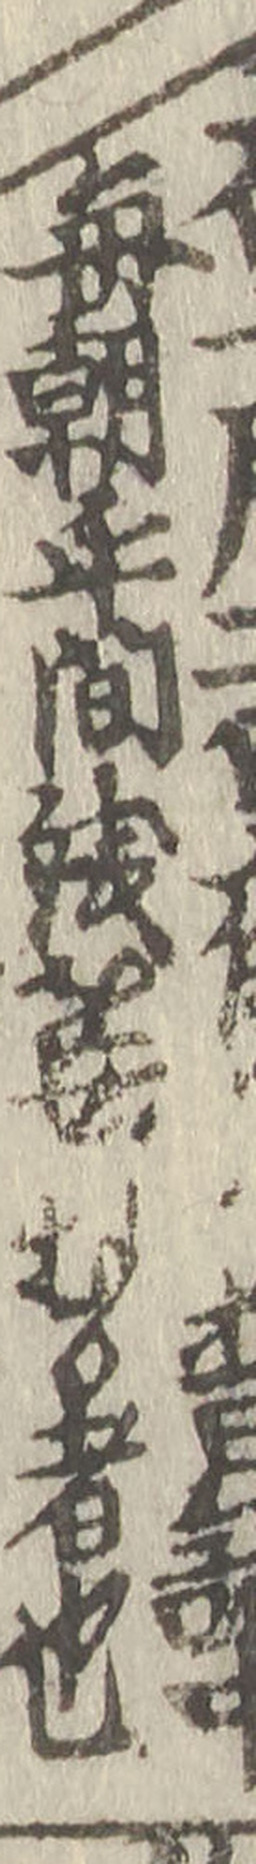毎朝手間銭をしむる者也
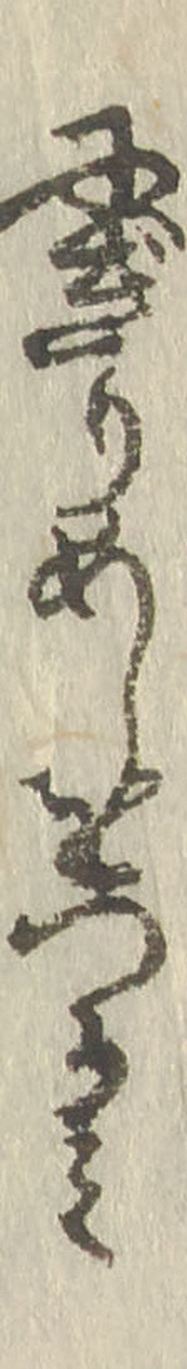にぎりめしをつかみ
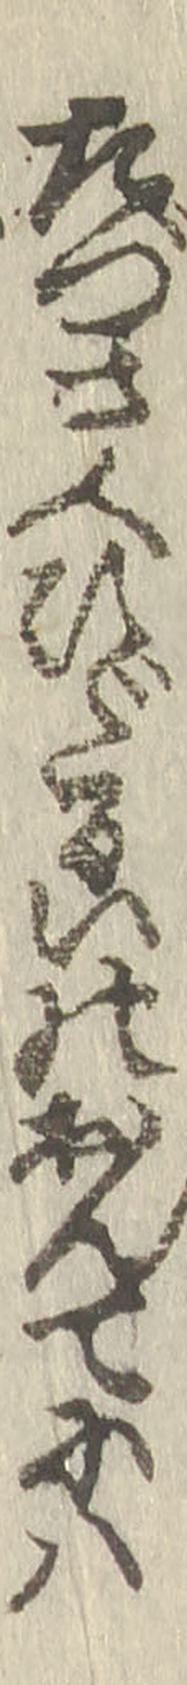たづさへひだるいのおんてには
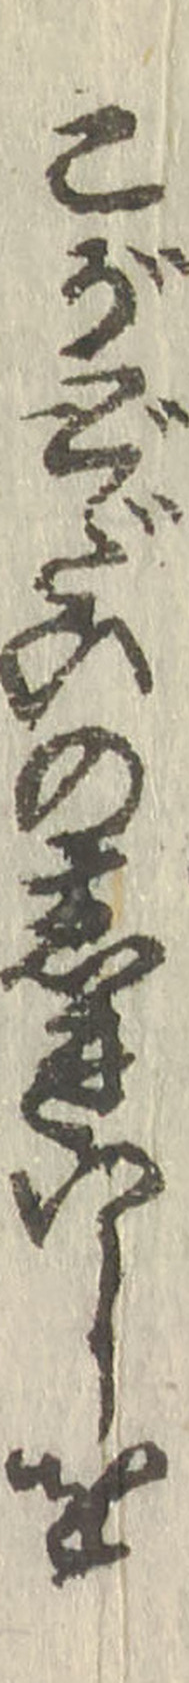こがどだいのしきいしを
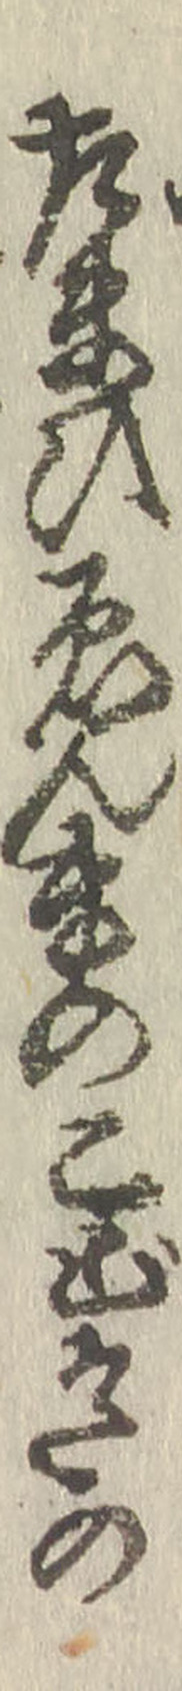たまひゑんまのこどかたの
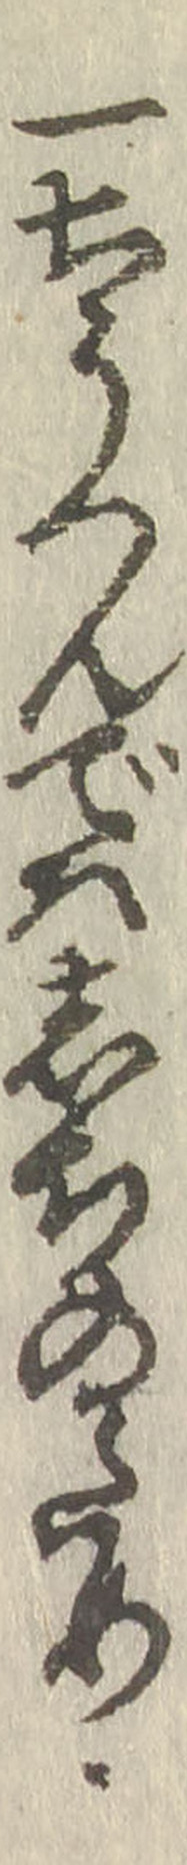一ちうつんではしちのため
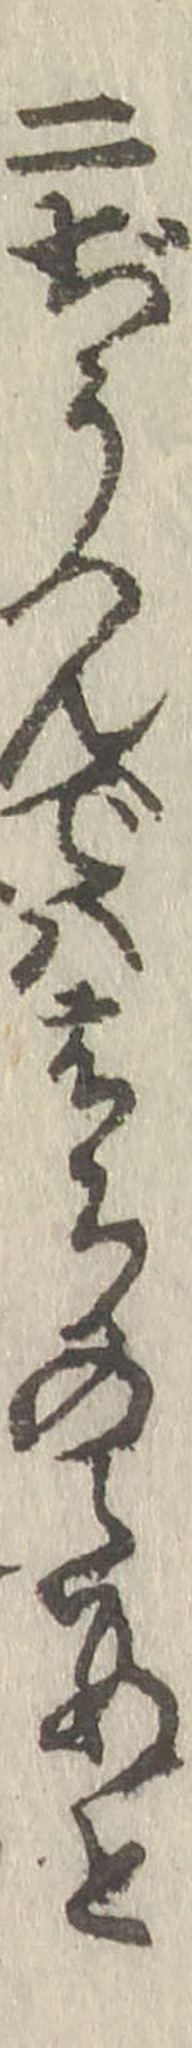二ぢうつんでははらのためと
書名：左官無二如来家根之瓦土蔵菩薩開帳由来記
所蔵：東京大学総合図書館 General Library in the University of Tokyo, JAPAN
